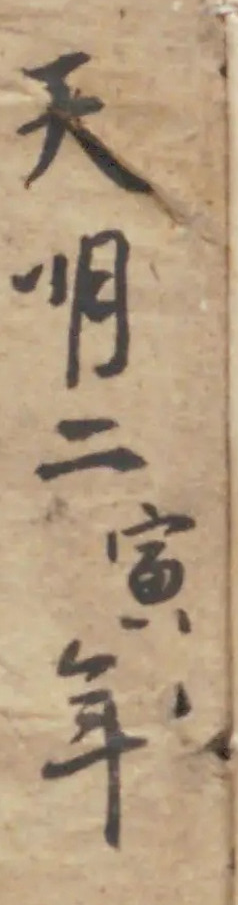天明二寅年

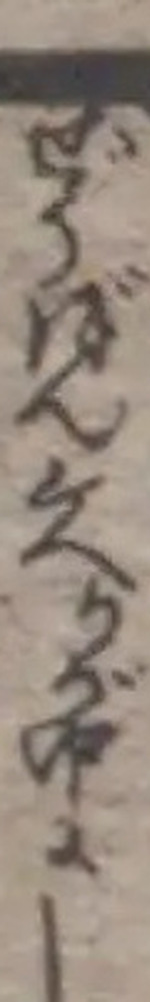ぜうばん二人りが中に
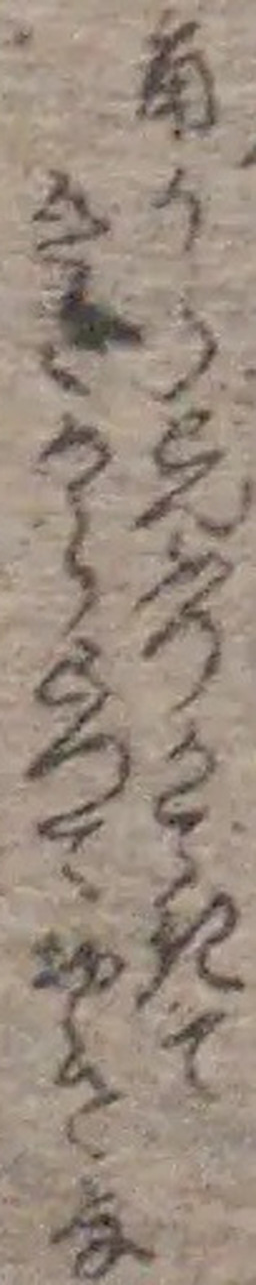きからつておきな

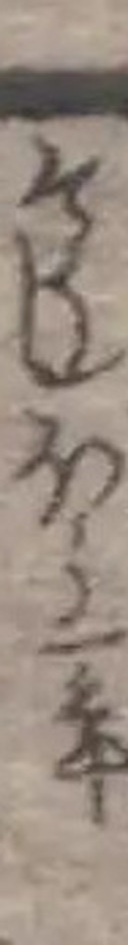そうしほと年
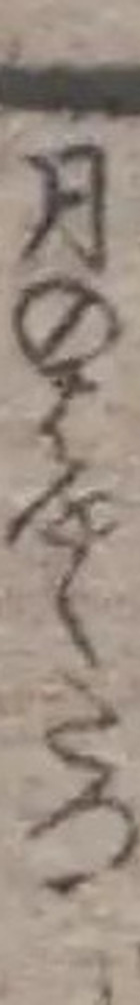月のはやくたつ
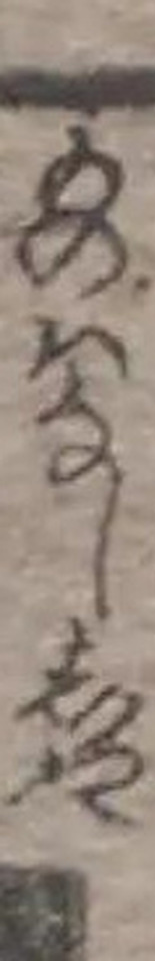ものはなししや
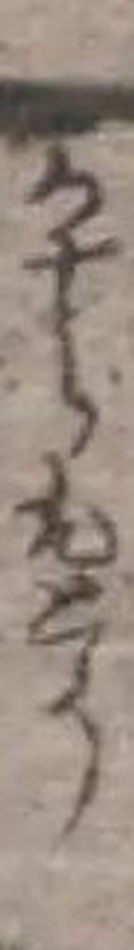か十郎もとう
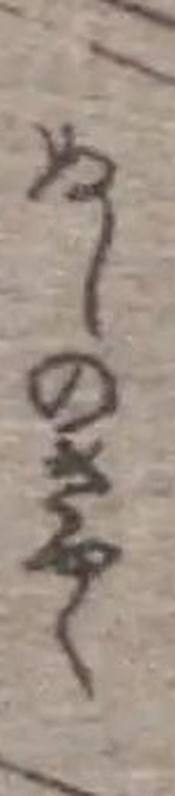ぬしのきやく
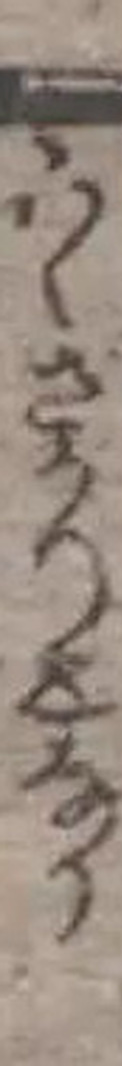らくざかりとなり
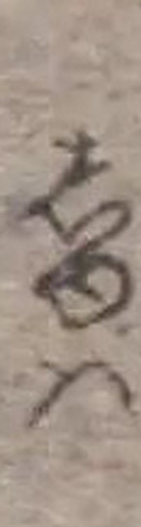しゆは
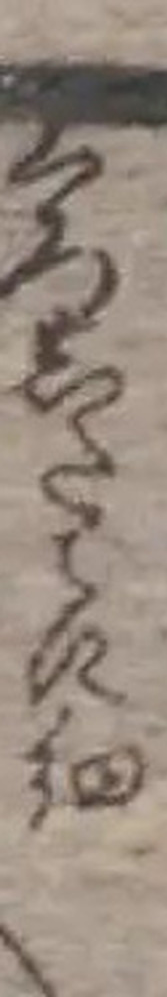くろしたはき細
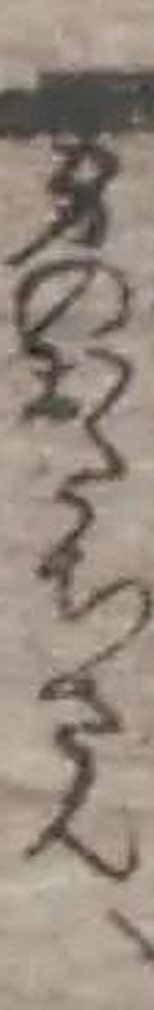身のおたちさん
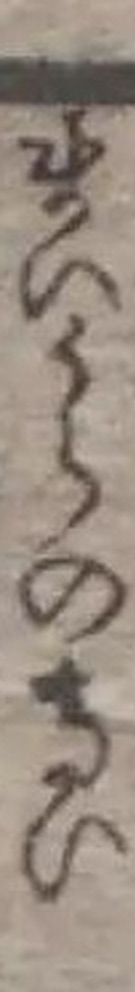まいうらの高ひ
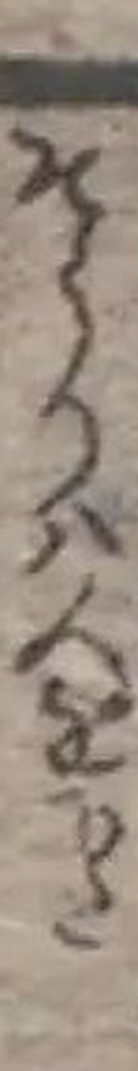そうりは人を下た
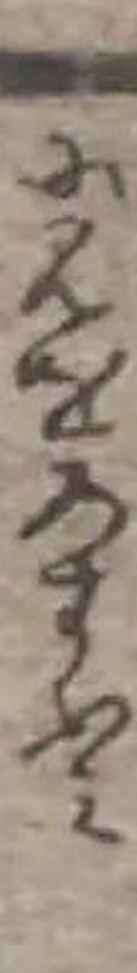に見をろすふみ
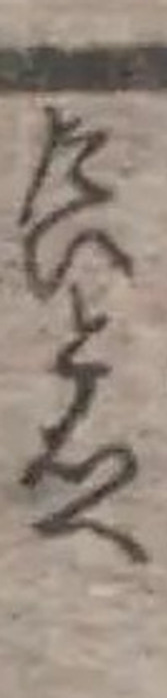たいと見へ
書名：早出来 3巻
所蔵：国立国会図書館 National Diet Library, JAPAN
